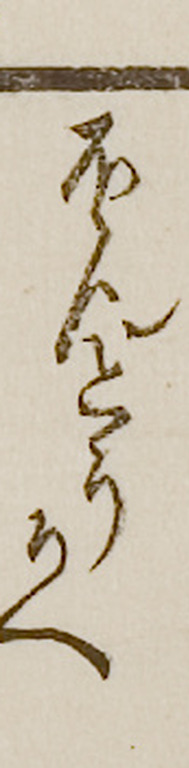ほんとうかへ
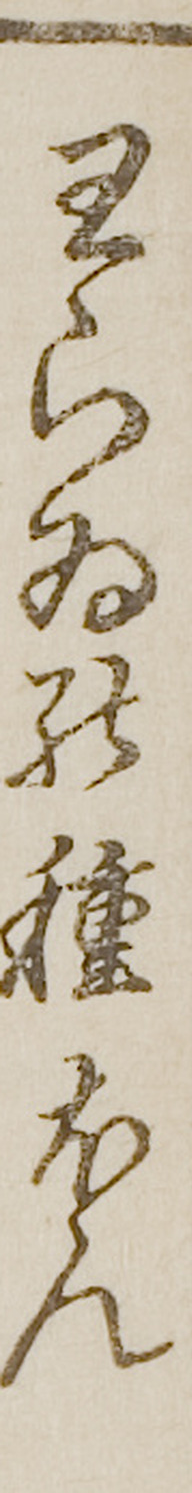わらいの種ほん
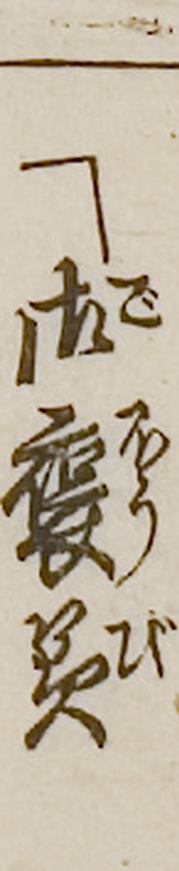〽御褒美
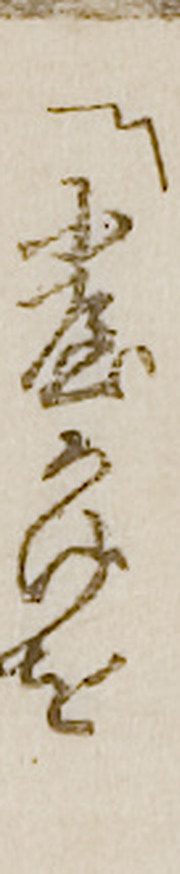小屋かけを
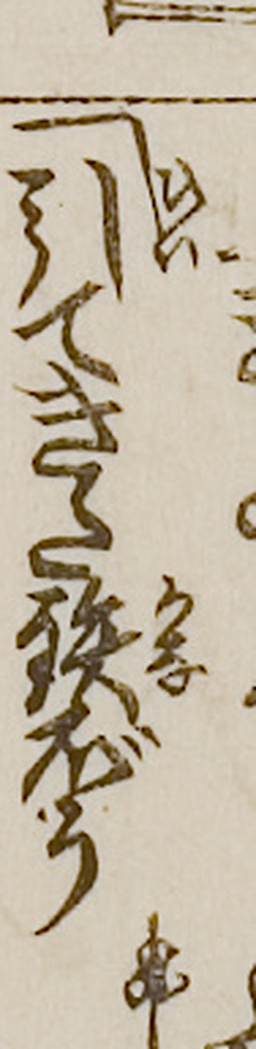〽引てきた鉄ぼう
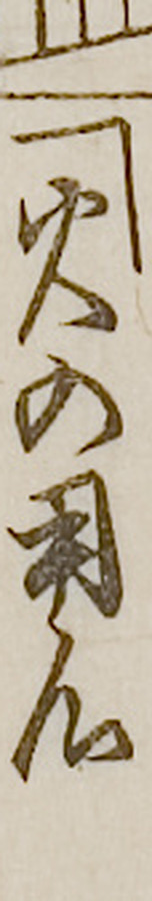〽火の用心
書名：夜中笑いの種
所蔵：東京大学総合図書館 General Library in the University of Tokyo, JAPAN
